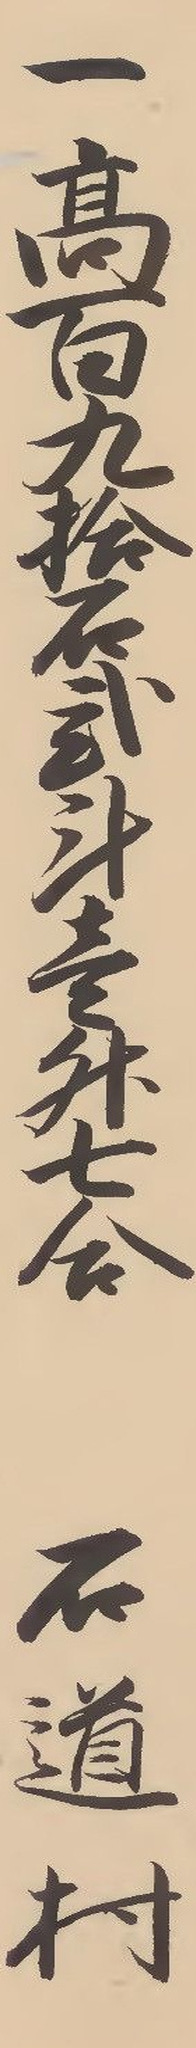一高百九拾石弐斗壱升七合石道村
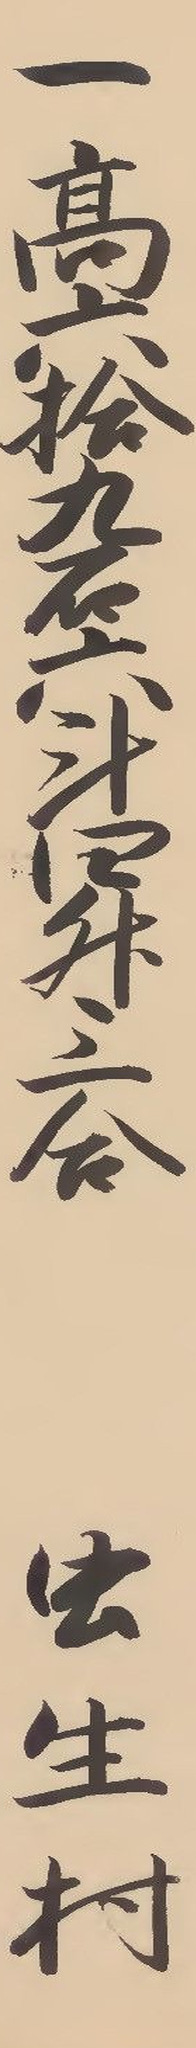一高六拾九石六斗四升三合虫生村
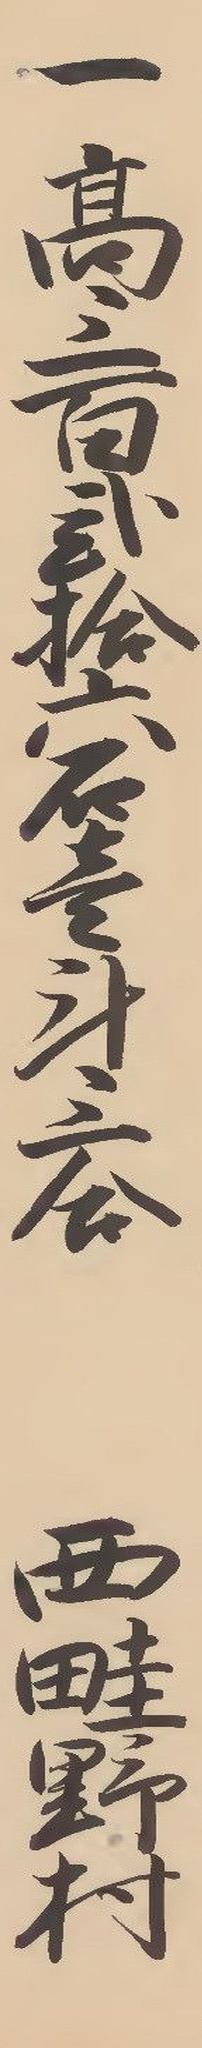一高三百弐拾六石壱斗三合西畦野村

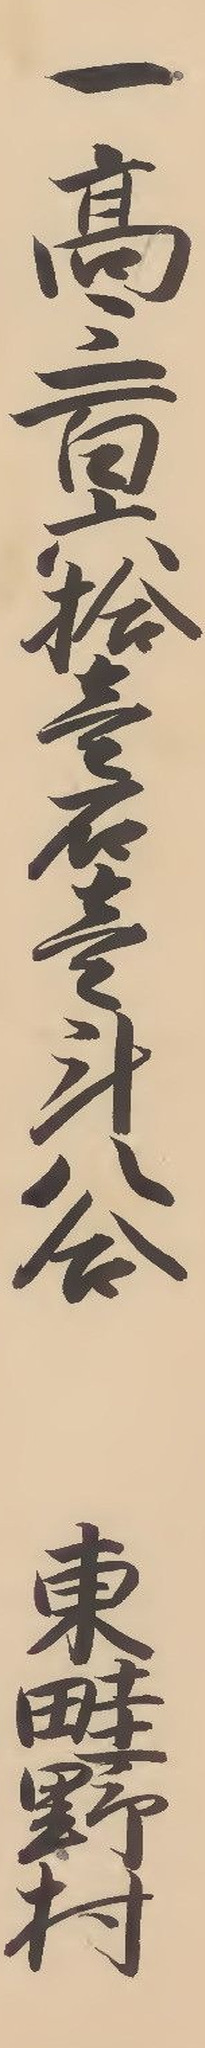一高三百六拾壱石壱斗八合東畦野村
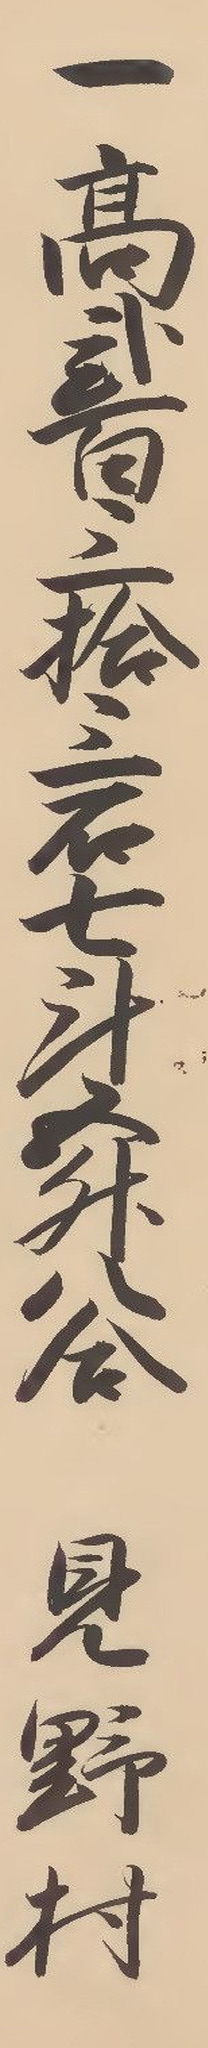一高弐百三拾三石七斗五升八合見野村
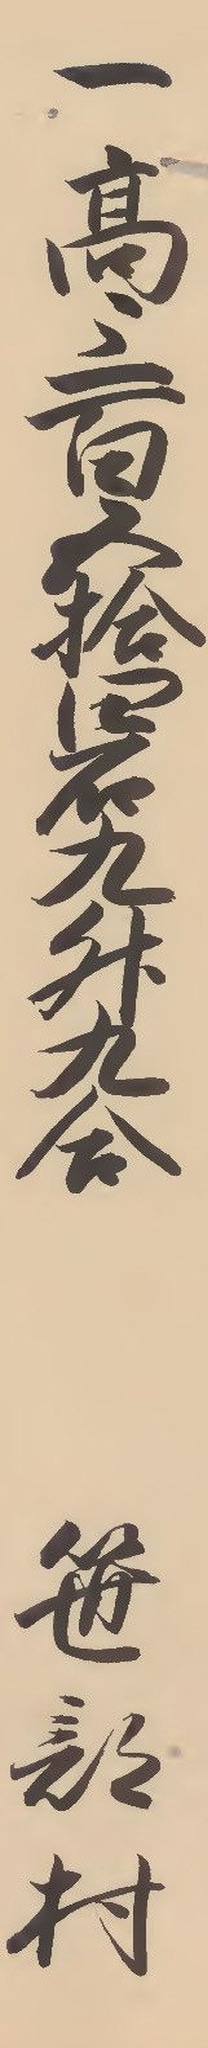一高三百五拾四石九升九合笹部村
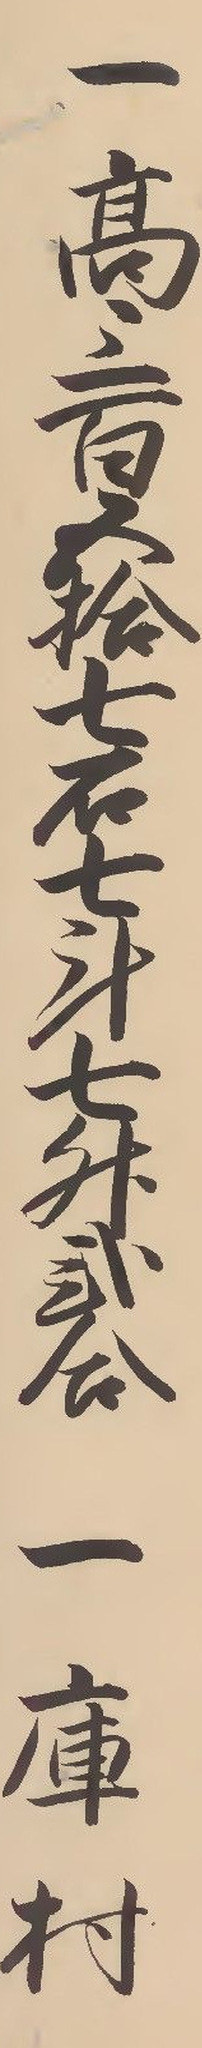一高三百五拾七石七斗七升弐合一庫村
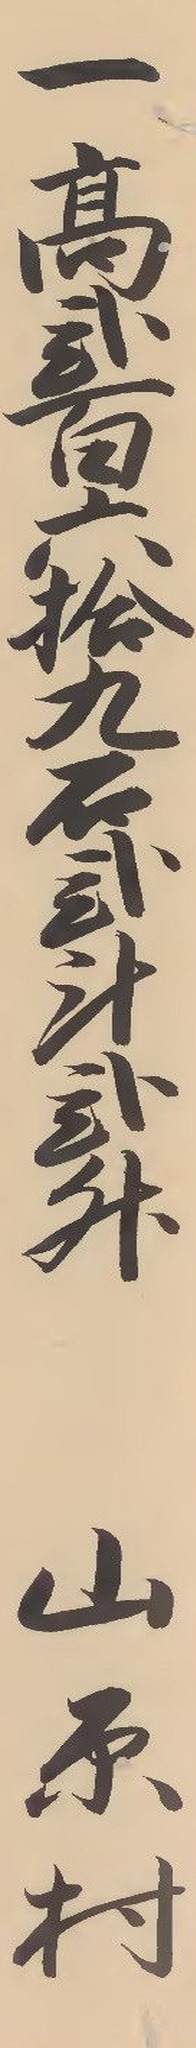一高弐百六拾九石弐斗弐升山原村
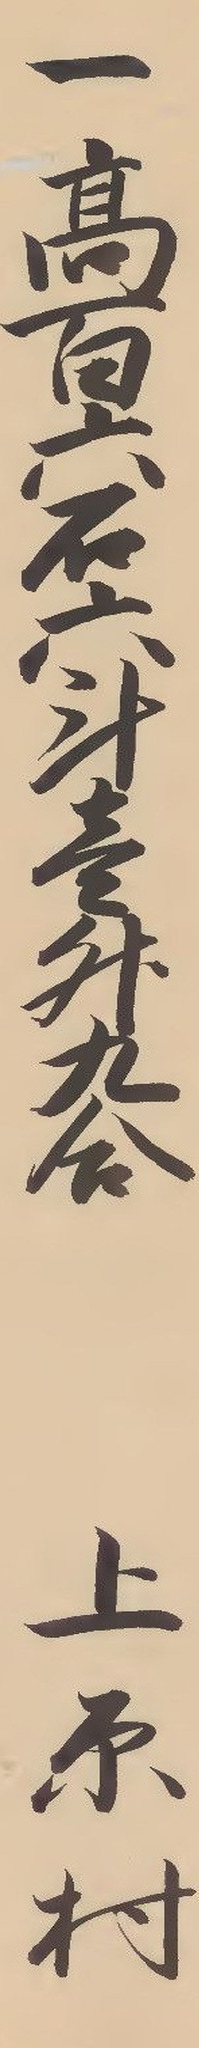一高百六石六斗壱升九合上原村
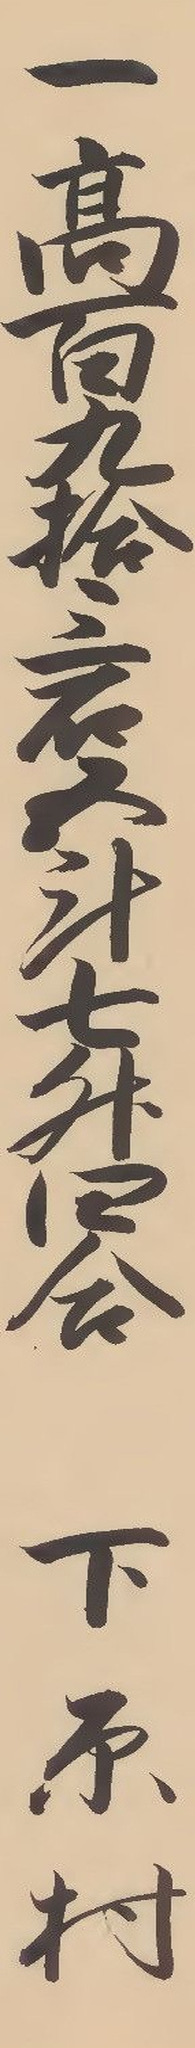一高百九拾三石五斗七升四合下原村
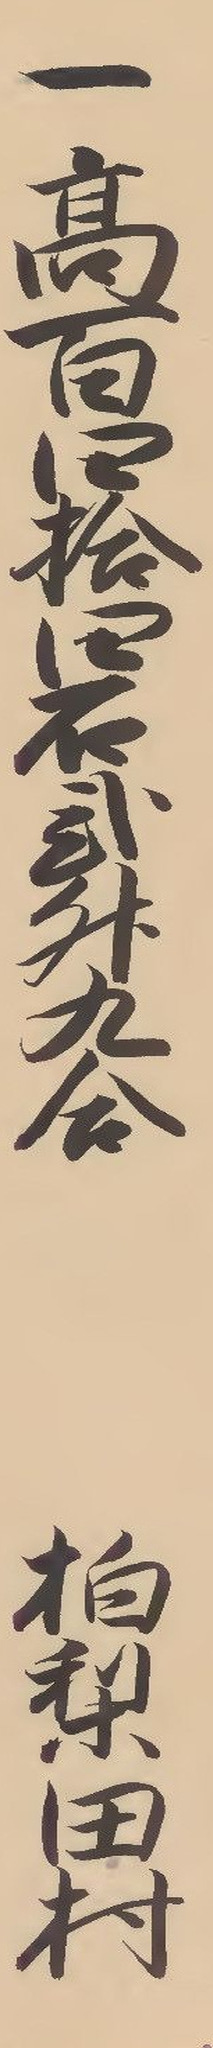一高百四拾四石弐升九合柏梨田村

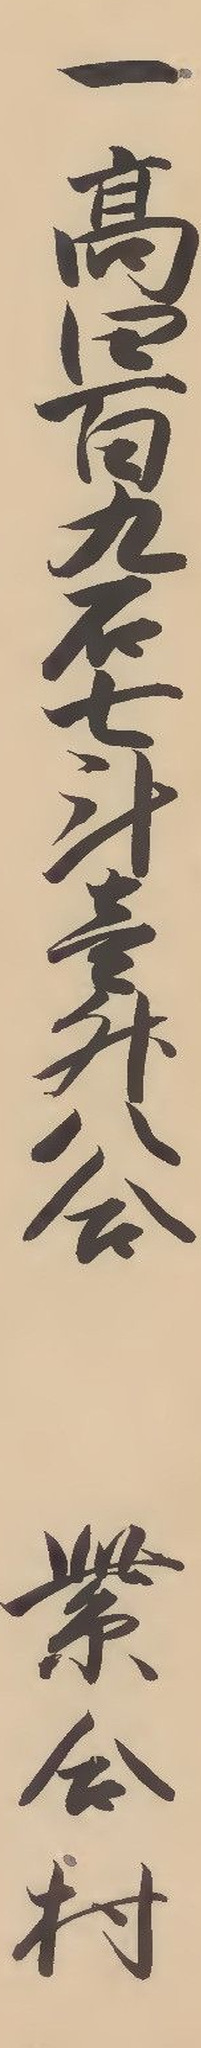一高四百九石七斗壱升八合紫合村
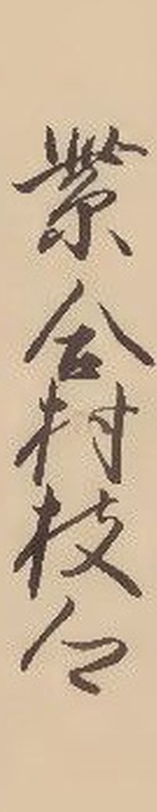紫合村枝郷
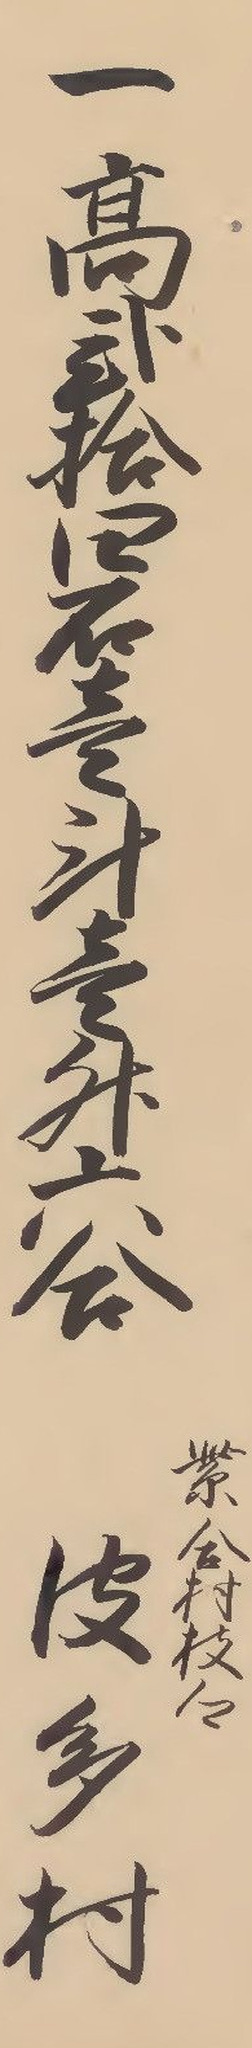一高弐拾四石壱斗壱升六合皮多村
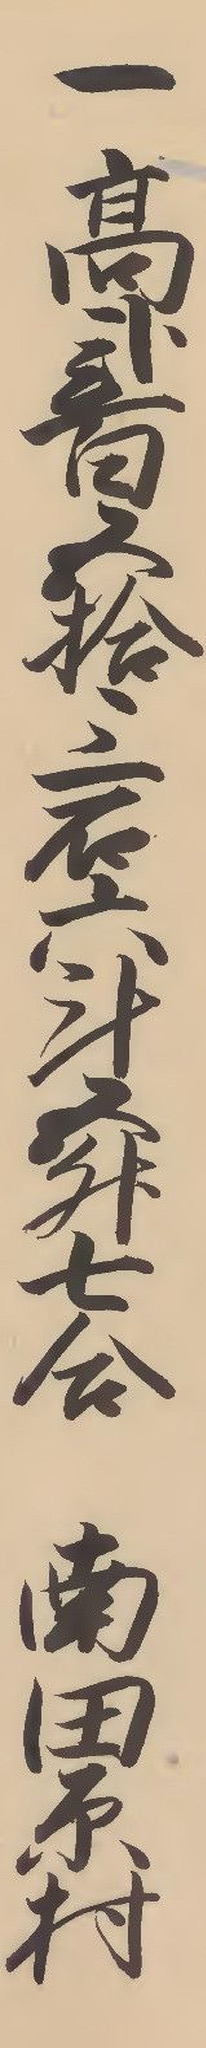一高弐百五拾三石六斗五升七合南田原村
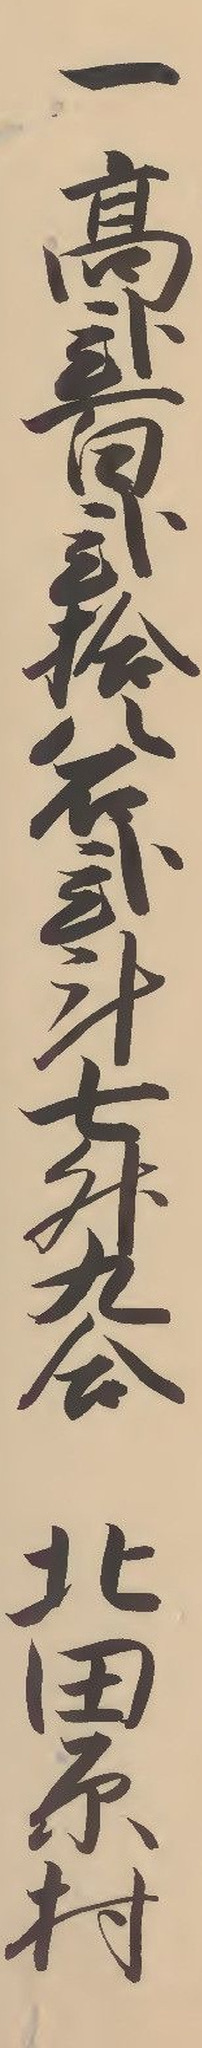一高弐百弐拾八石弐斗七升九合北田原村
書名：摂津国郷帳
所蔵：国立公文書館 National Archives of Japan
